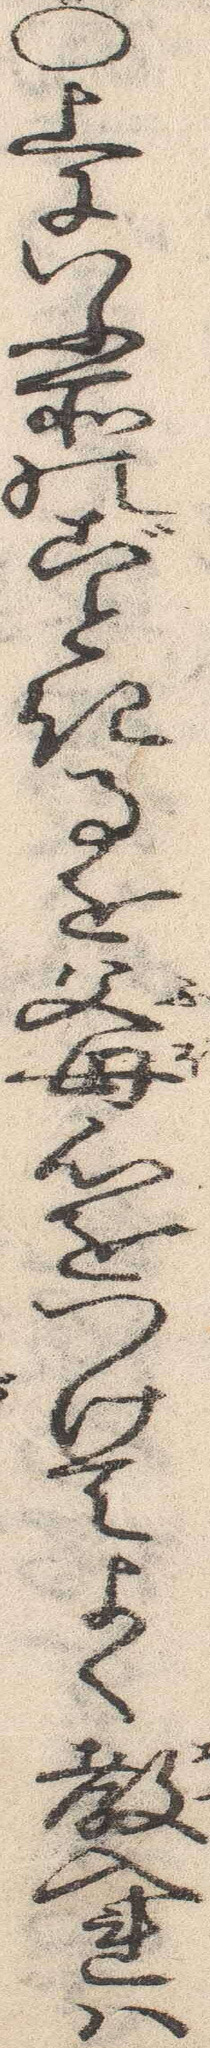○上にいふ所のごとき事を父母心をつけてよく教入れは
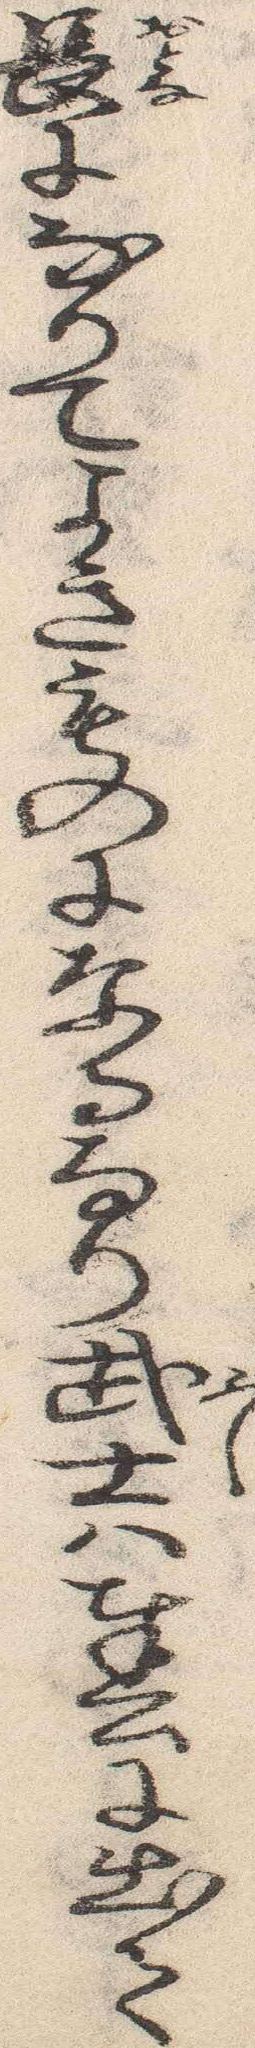長になりてよきものになるなり武士は奉公に出て
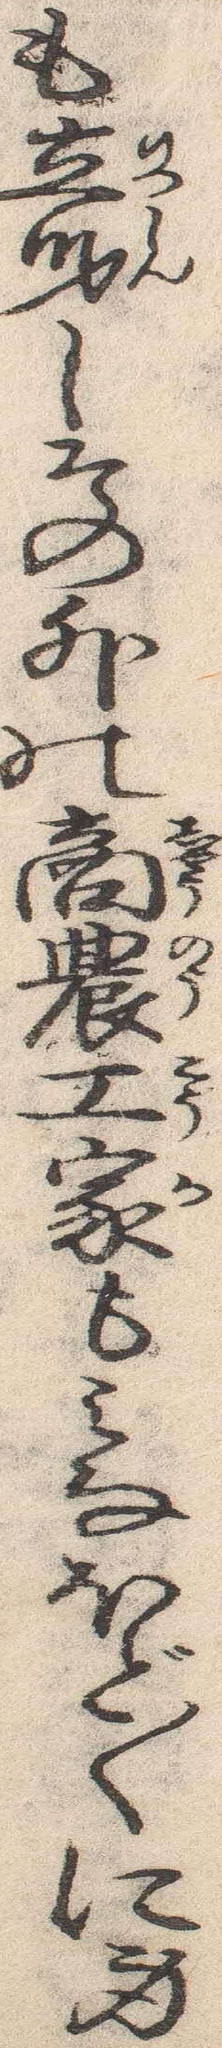も立身しその外の商農工家もみなほど〳〵に身
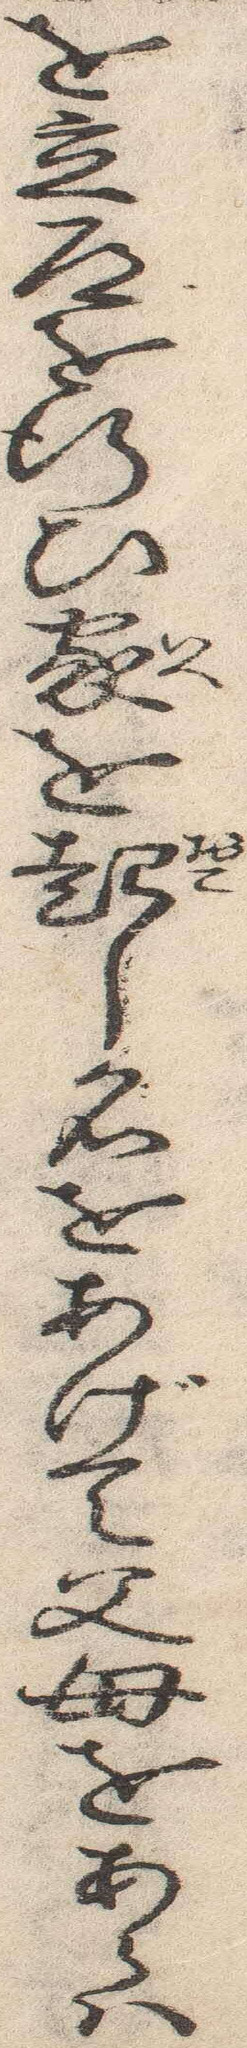を立道を行ひ家を起し名をあげて父母をあらは
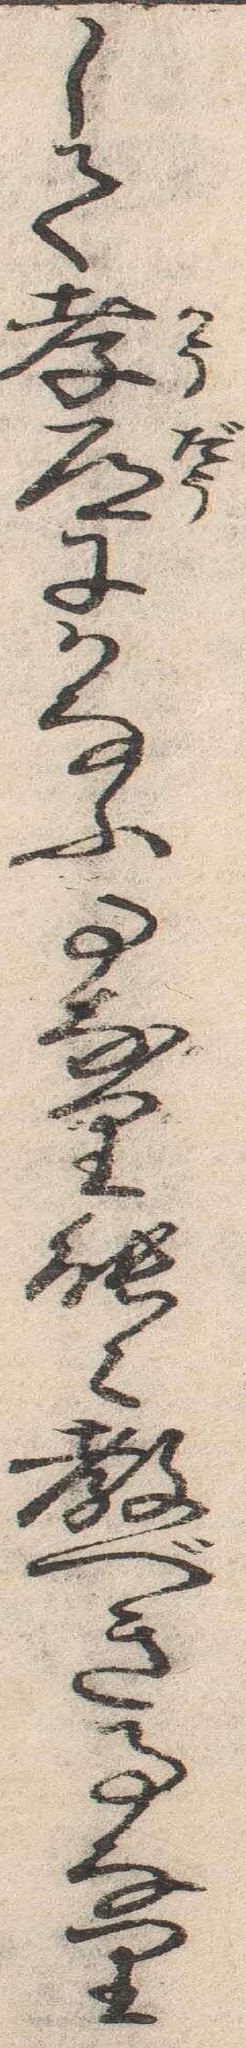して孝道にかなふ事なり能々教べき事なり
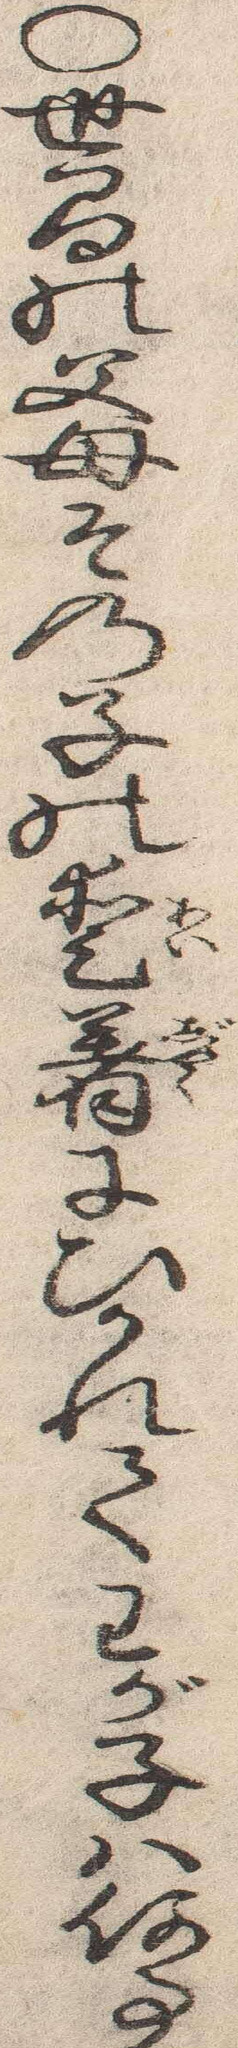○世間の父母その子の愛着にひかれてわが子は何事
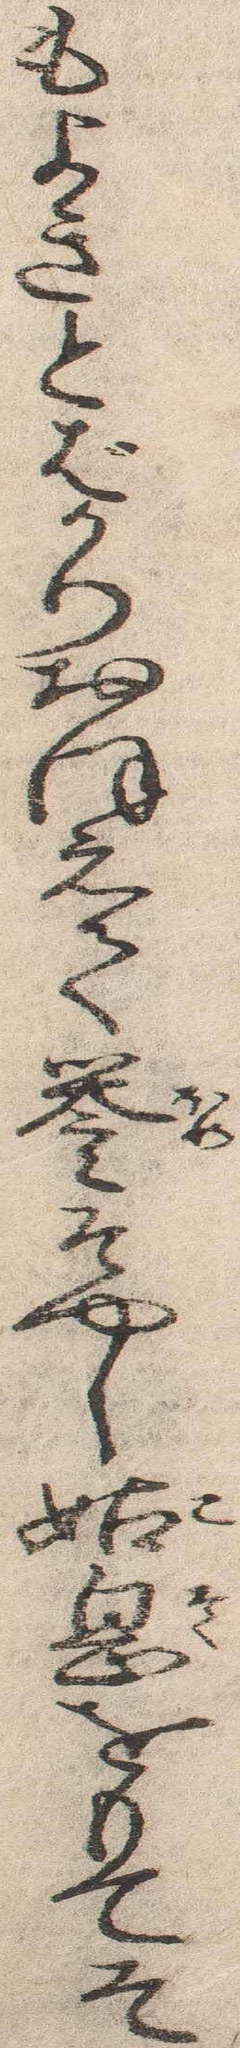もよきとばかりおほえて誉そやし姑息をもてそ
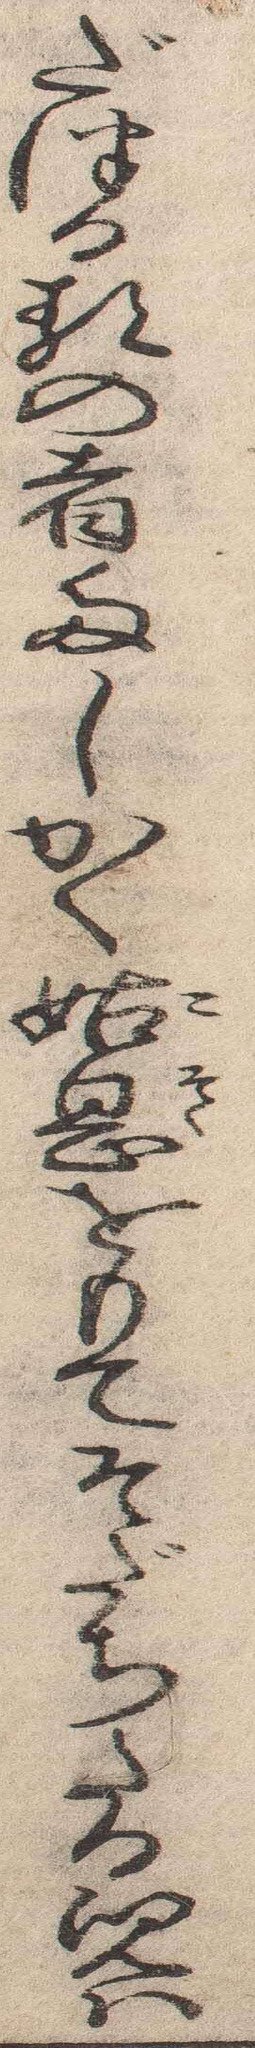だつる類の者多しかく姑息をもてぞだちたる児は

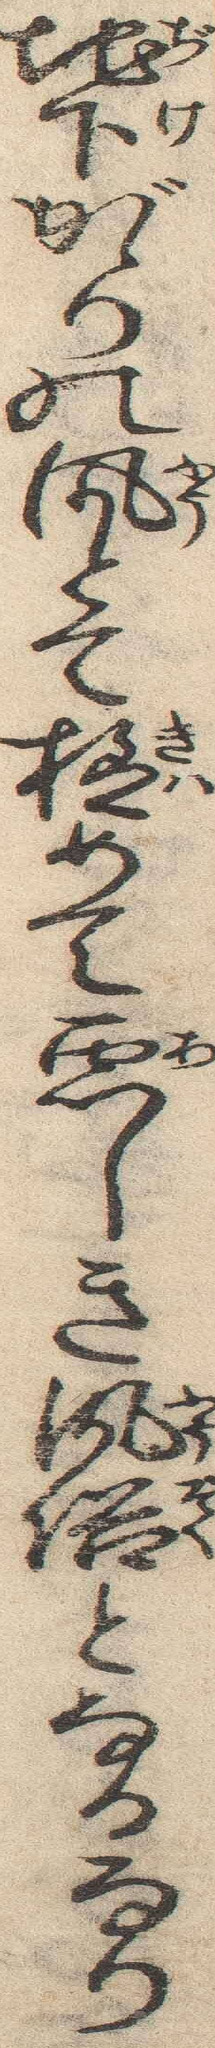地下がゝりの風とて極めて悪しき風俗となるなり
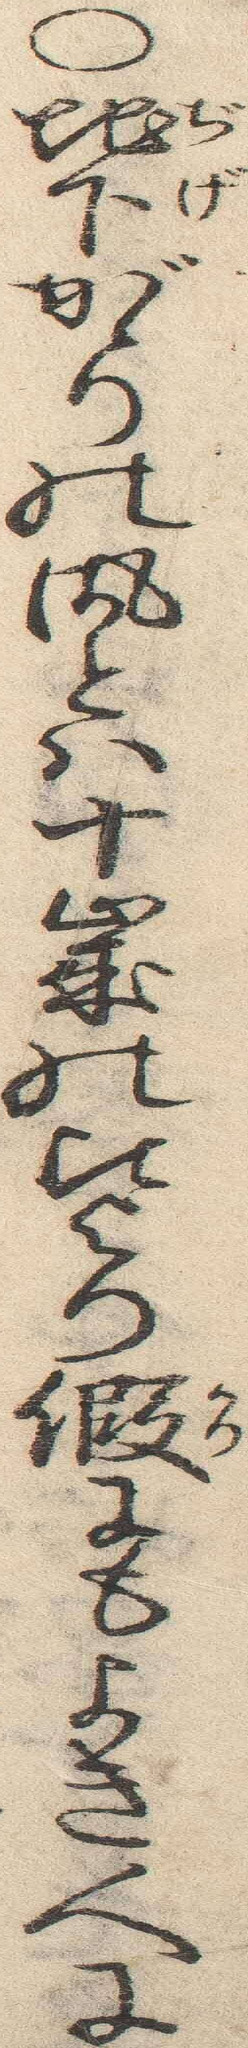○地下がゝりの風とは十歳の比より仮にもよき人に
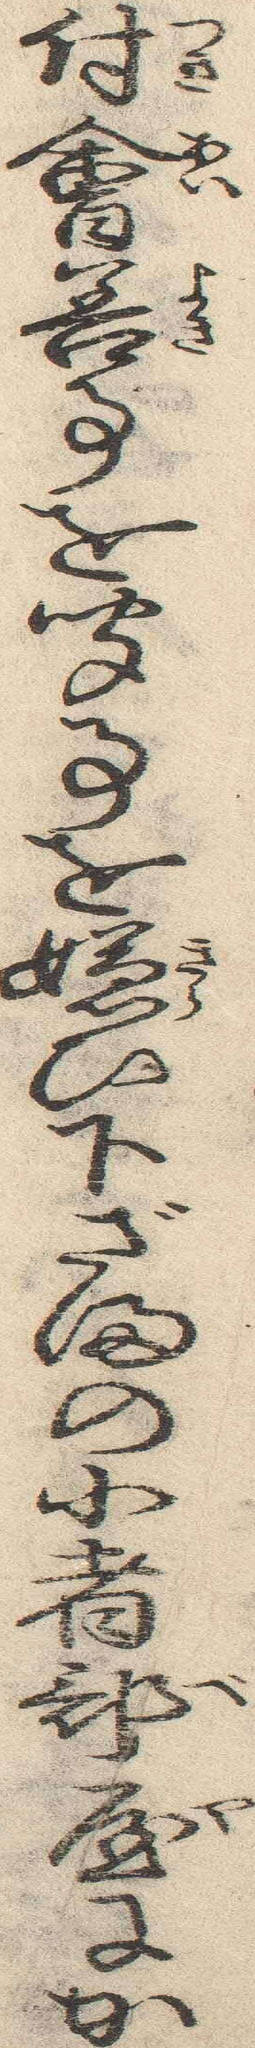付会善事を聞事を嫌ひ下ざまの小者部屋にか
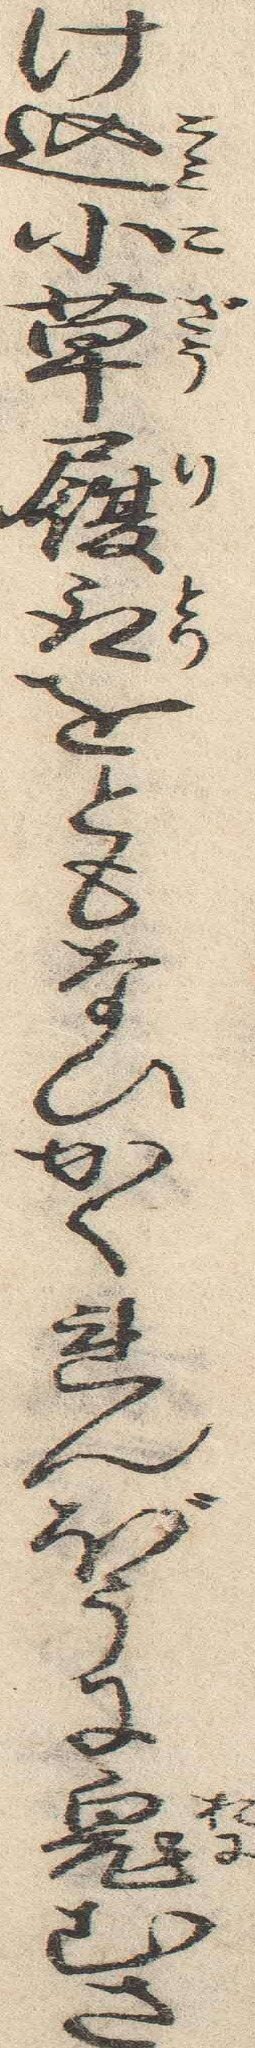け込小草履取をともなひかくれんぼうに鬼むさ
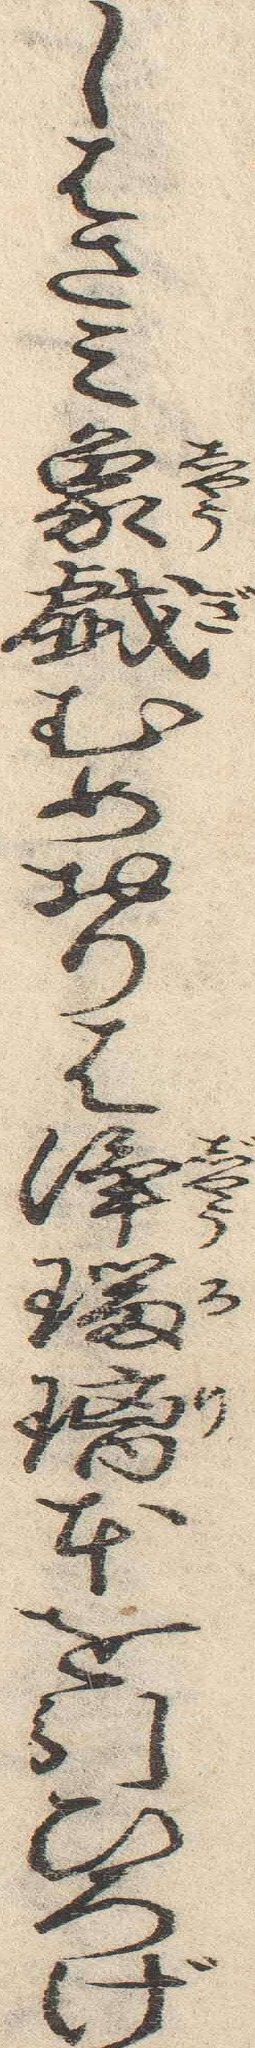しはさみ象戯むめおりは浄瑠璃本を引ひろげ
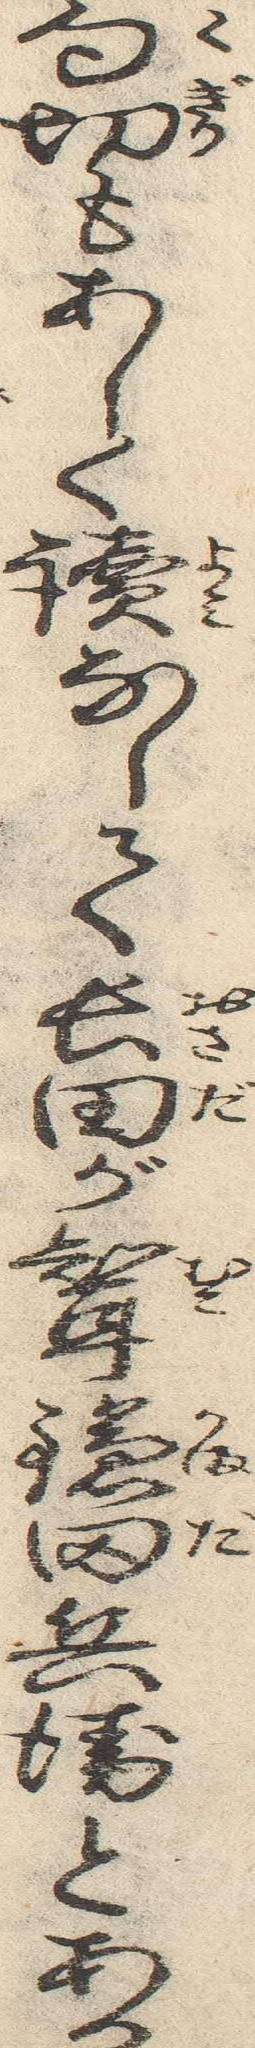句切もあしく読なして長田が聟鎌田兵衛とある
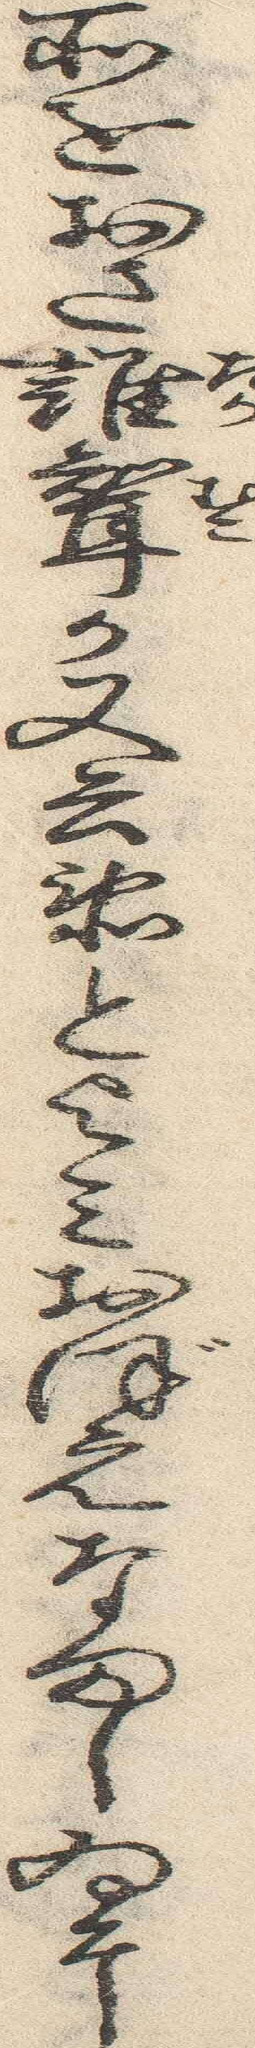所をおさ誰聟か又兵衛とよみおぼえなましゐに
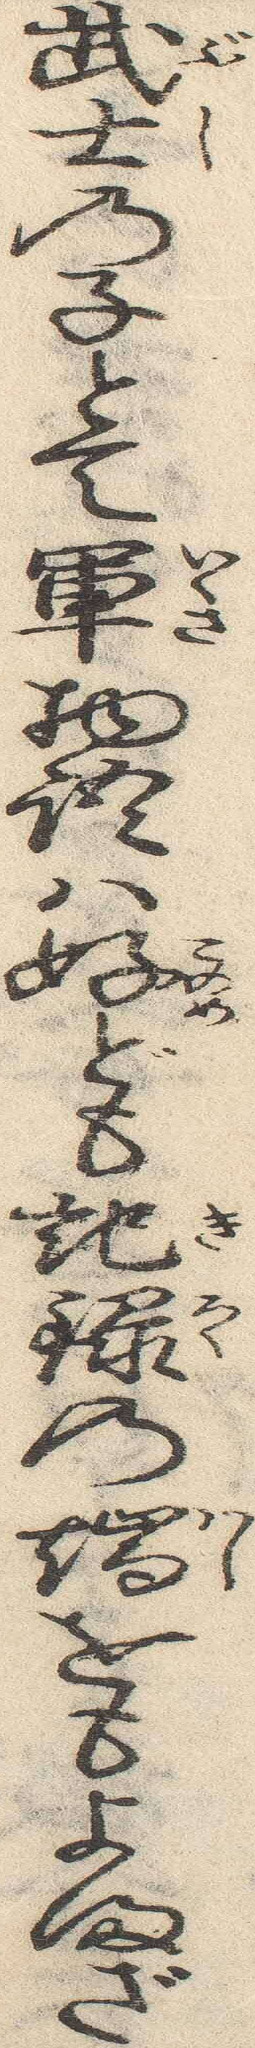武士の子とて軍物語は好ども記録の端をもよまざ
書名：小児必用養育草
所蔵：東京学芸大学附属図書館 国文学研究資料館
